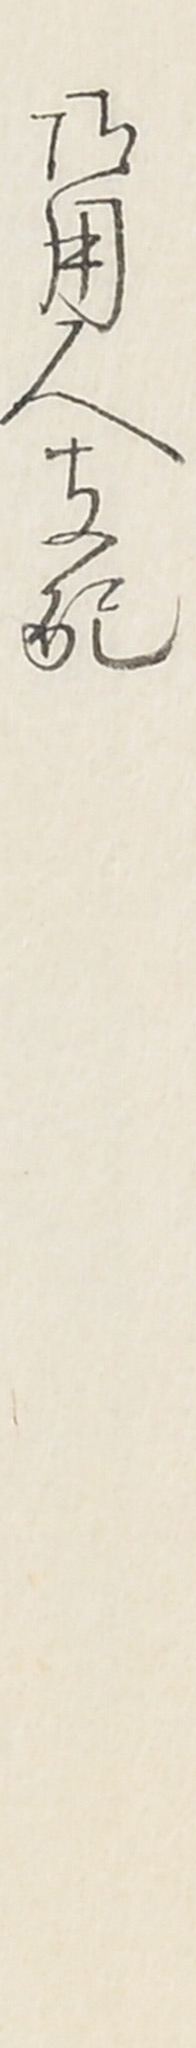御用人支配
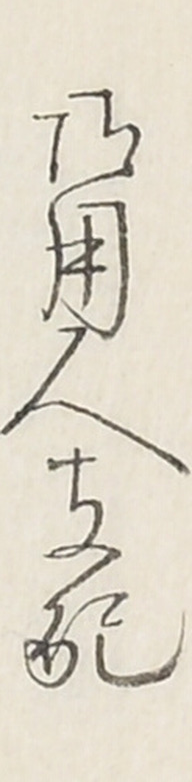御用人支配
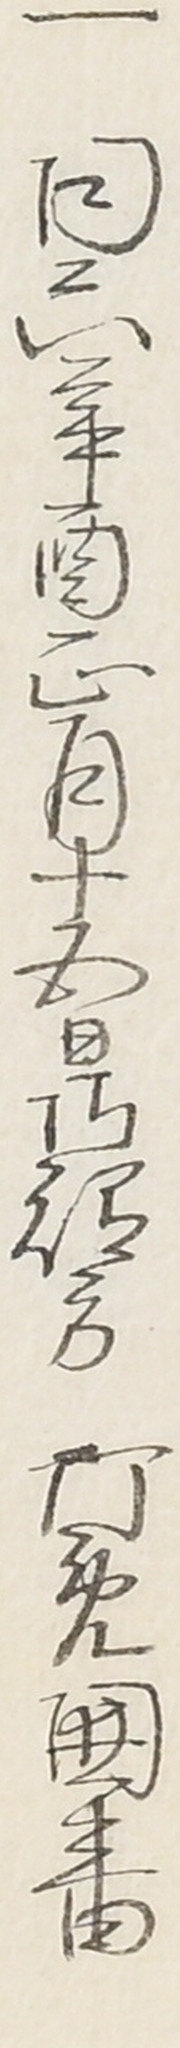一同六辛酉正月十五日御賄方御免囲番
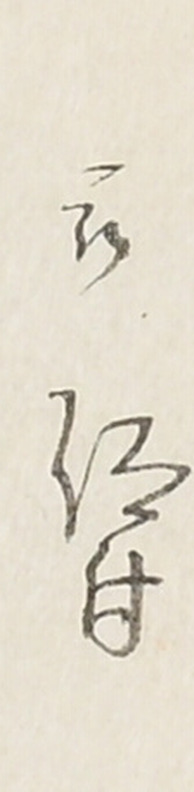被仰付
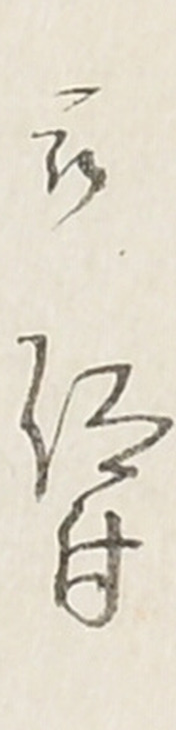被仰付
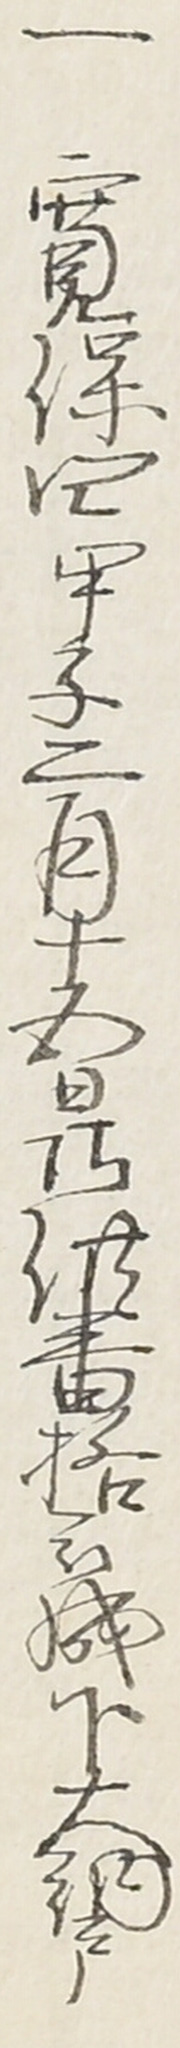一寛保四甲子二月十五日御供番格被成下大納戸
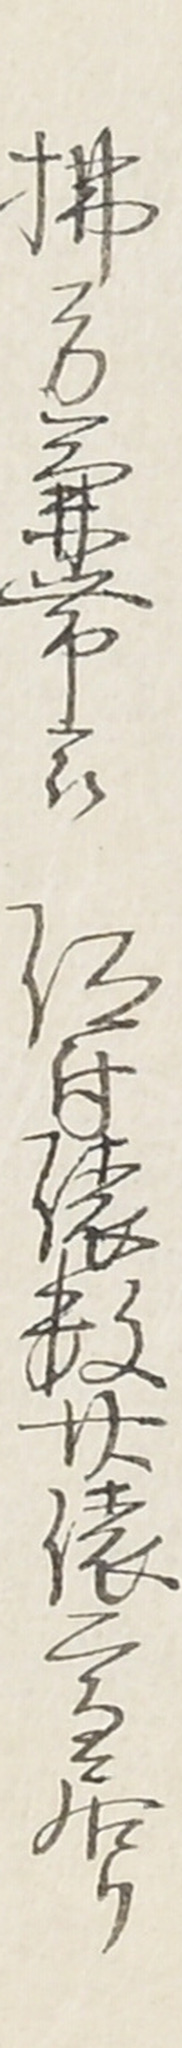払方兼帯被仰付俵数廿俵高居り
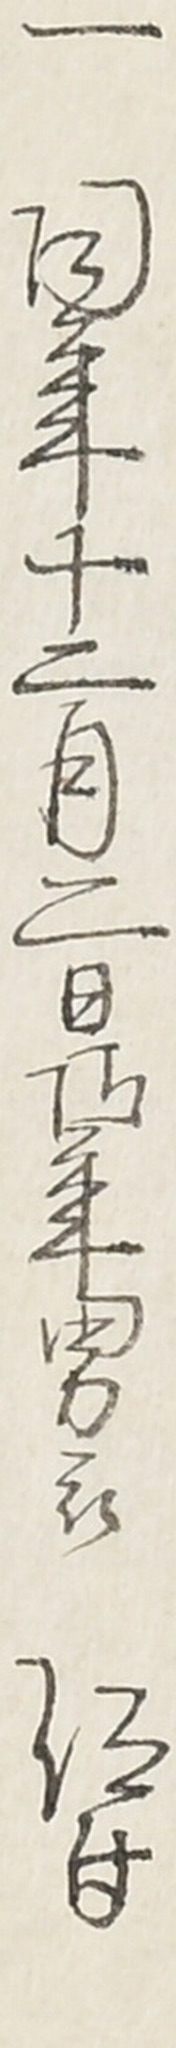一同年十二月二日御年男被仰付
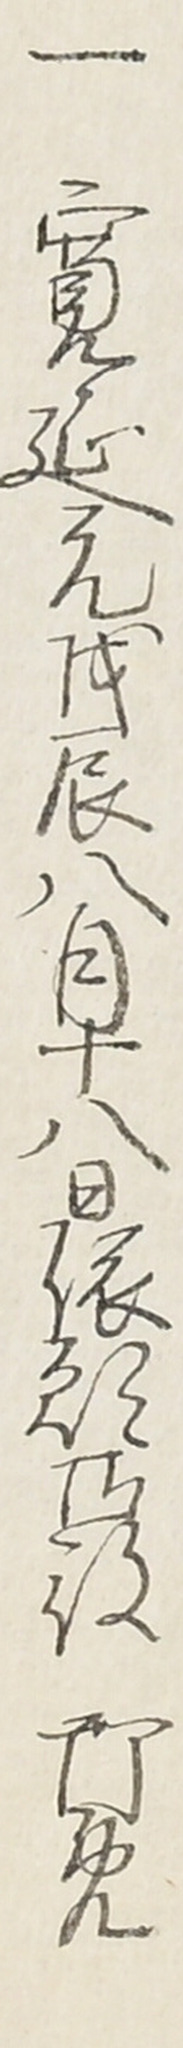一寛延元戊辰八月十八日依願御役御免
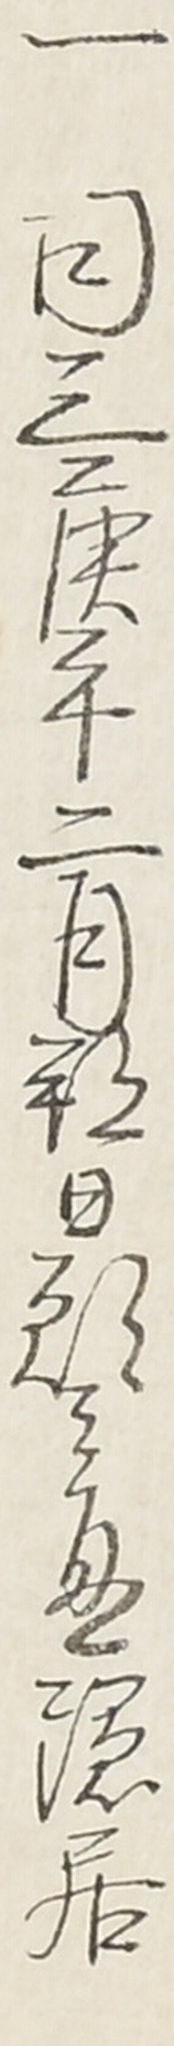一同三庚午二月朔日願之通隠居
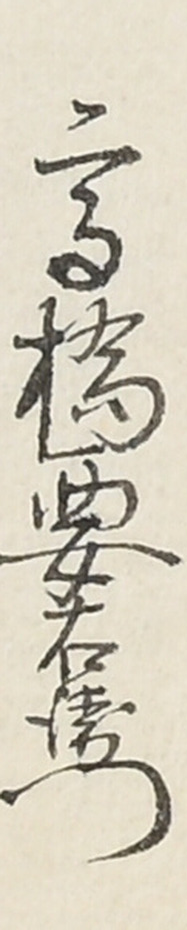高橋要右衛門
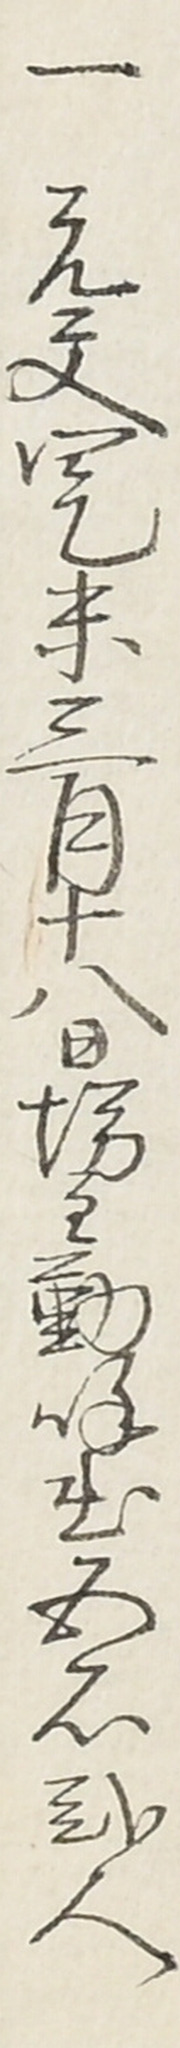一元文四乙未三月十八日坊主勤呼出五石弐人
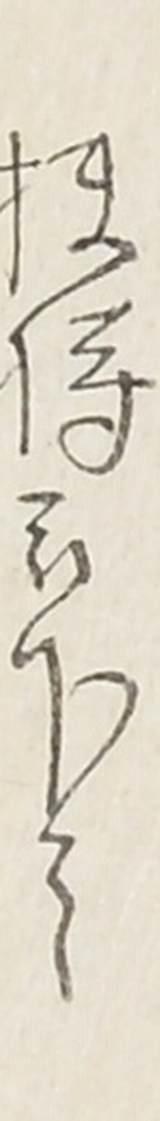扶持被下之
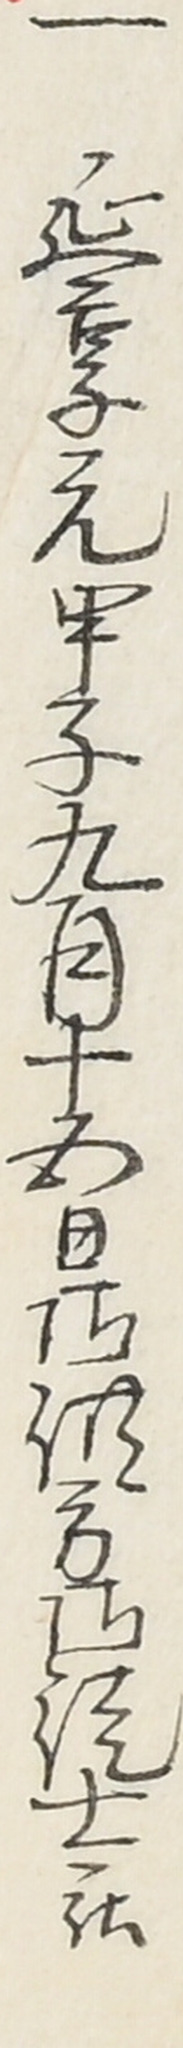一延享元甲子九月十五日御供方御徒士被

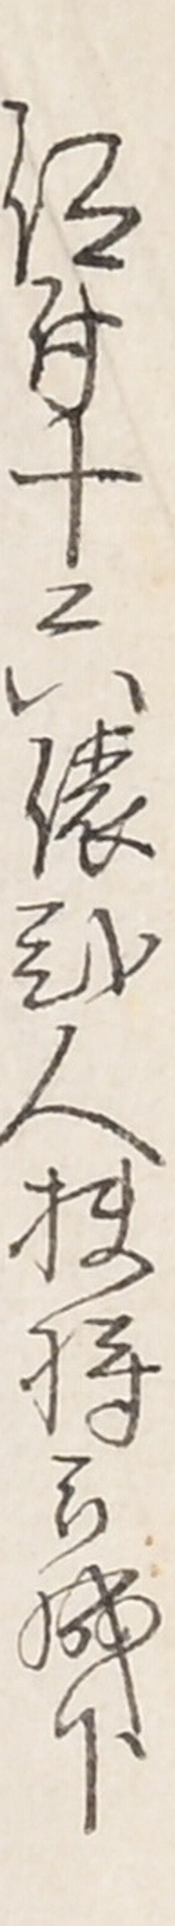仰付十六俵弐人扶持被成下
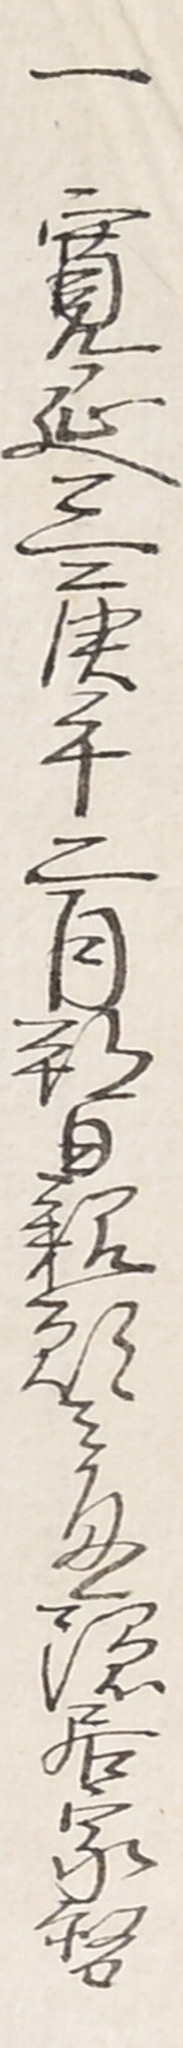一寛延三庚午二月朔日親願之通隠居家督
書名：無足諸士勤仕録（四）
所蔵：伊那市立高遠町図書館・合同会社AMANE
